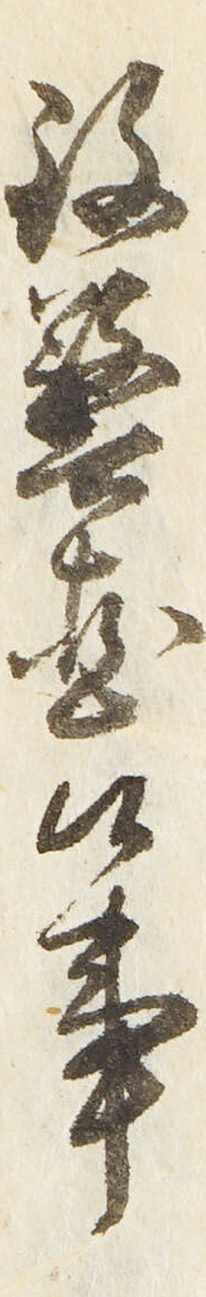致警固候事
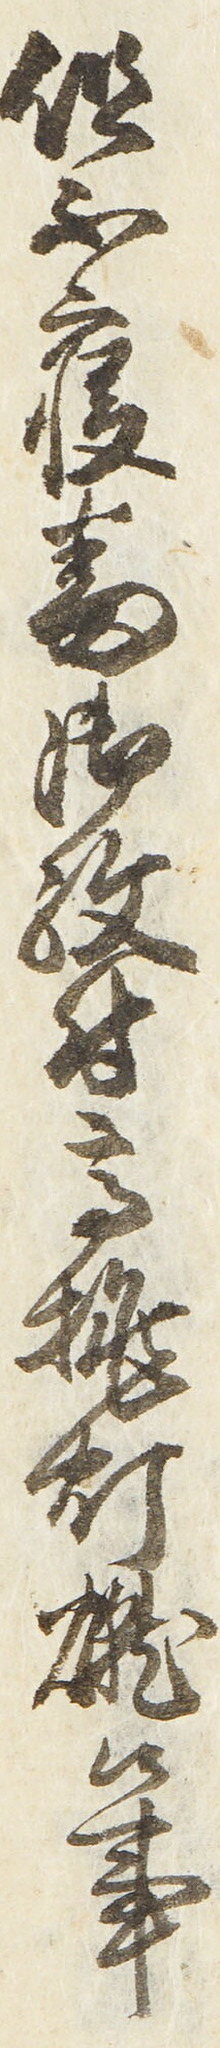但不寝番御紋付高挑灯燈候事
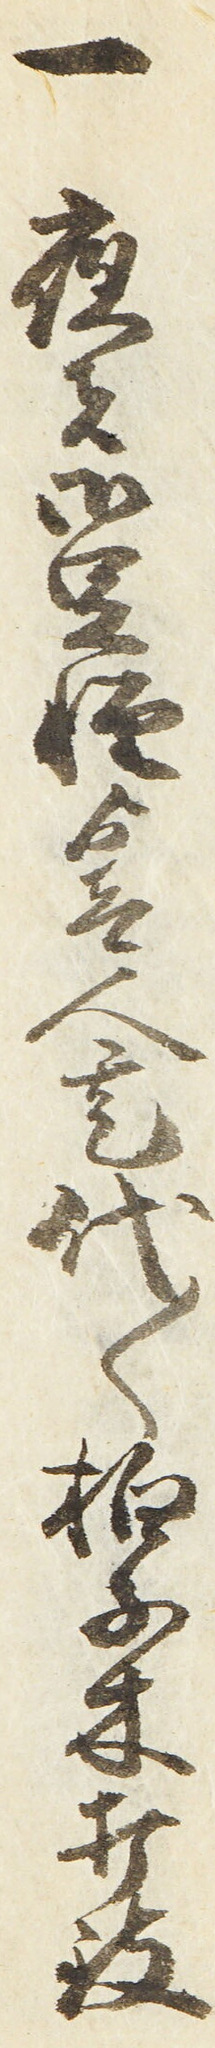一夜者御足軽ゟ壱人充代〳〵拍子木打致
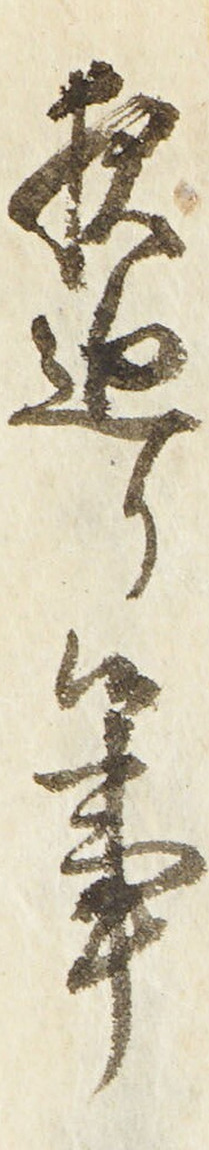夜廻り候事
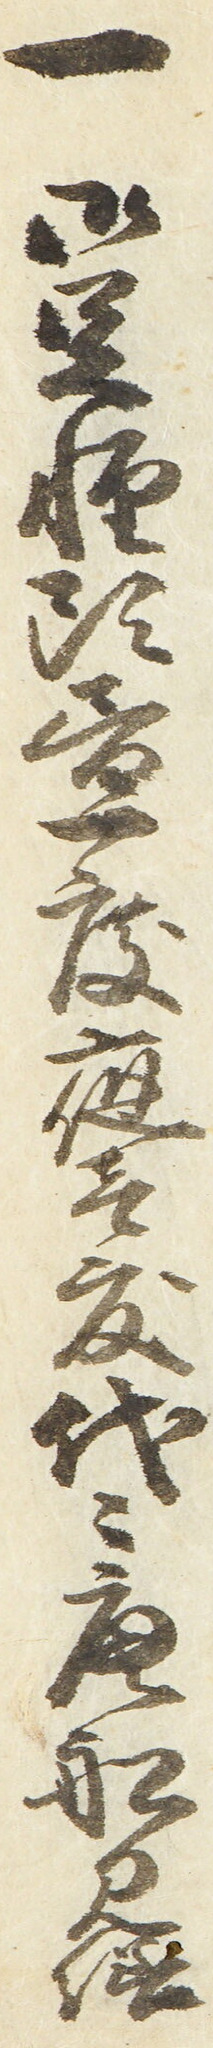一御足軽頭昼一度夜壱度代々唐船見繕

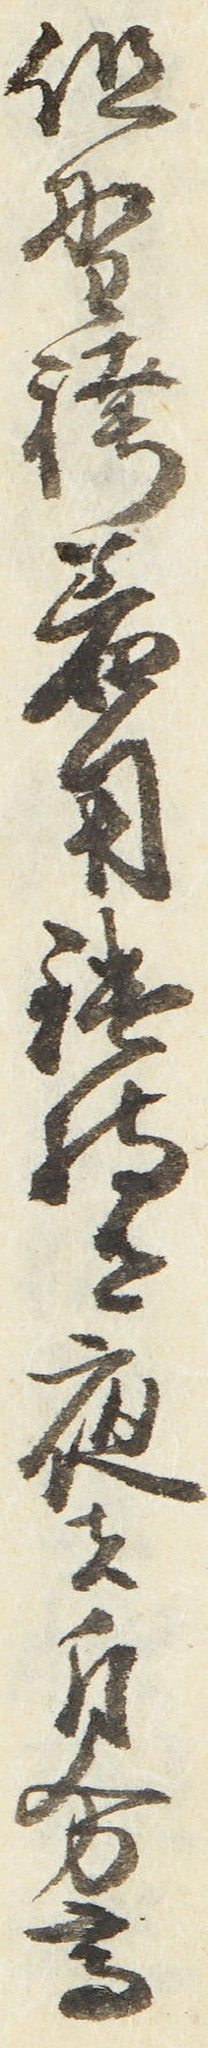但野袴着用鑓持は夜者自分高
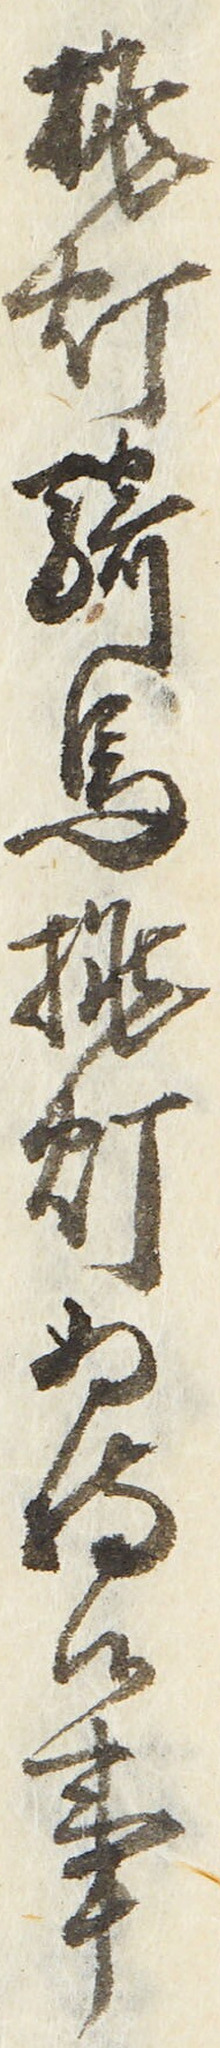挑灯騎馬挑灯為持候事
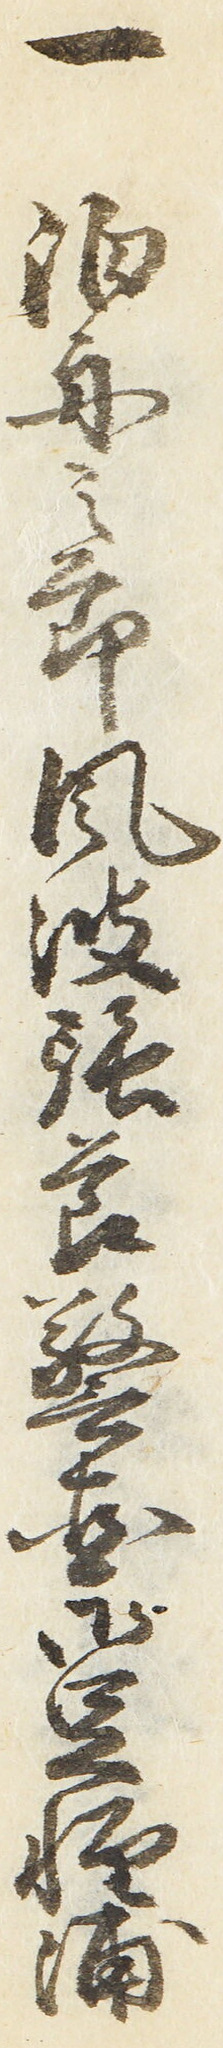一泊舟之節風波強節警固御足軽浦
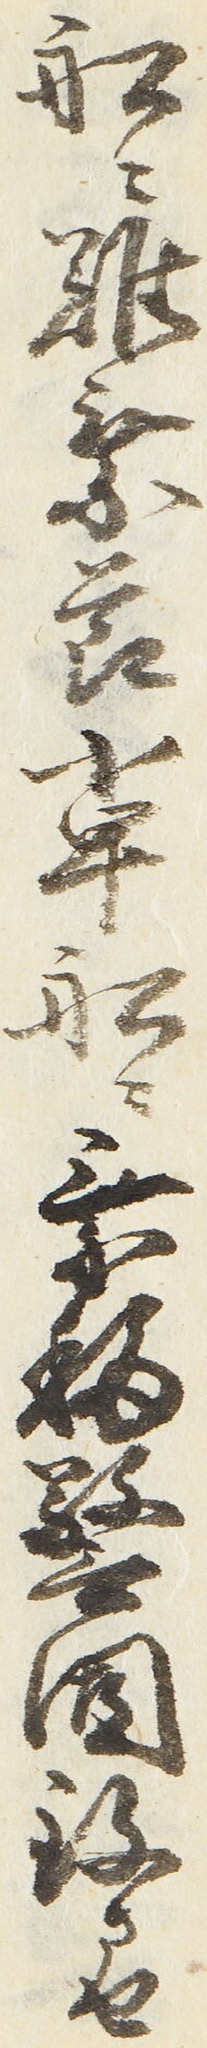船ニ難乗節小早船ニ乗移警固致さセ
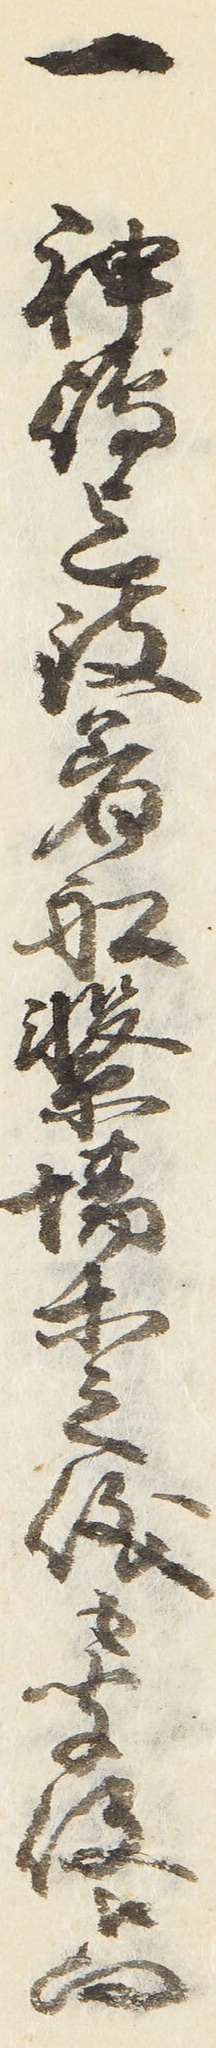一神嶋迄致着船繋場等之儀も聞役江向
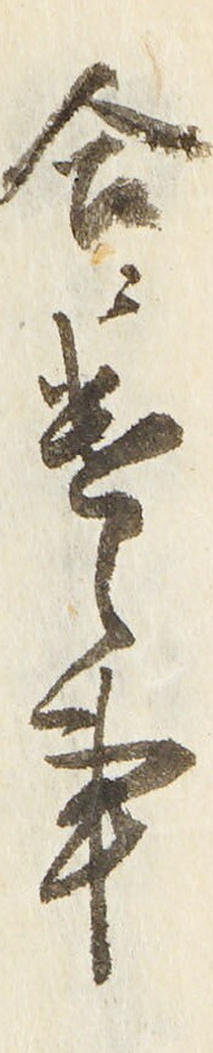合ニ遣候事
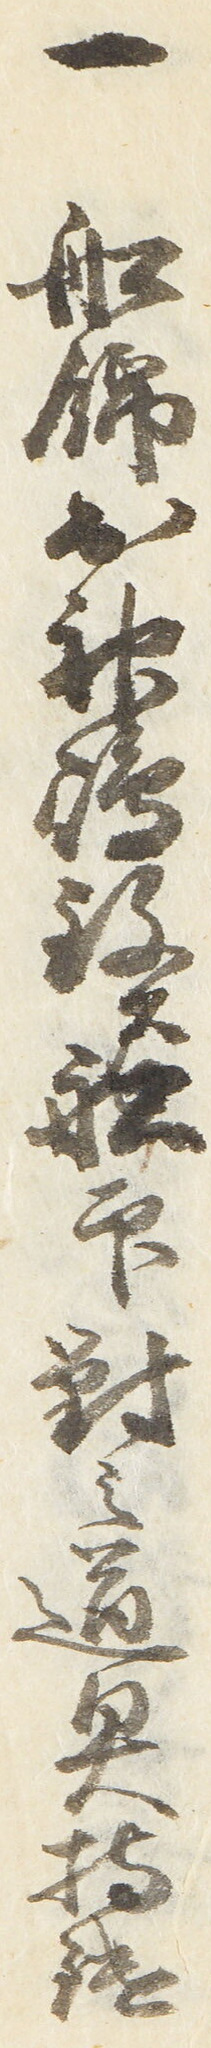一船飾於神嶋致ス船印対之道具持鑓
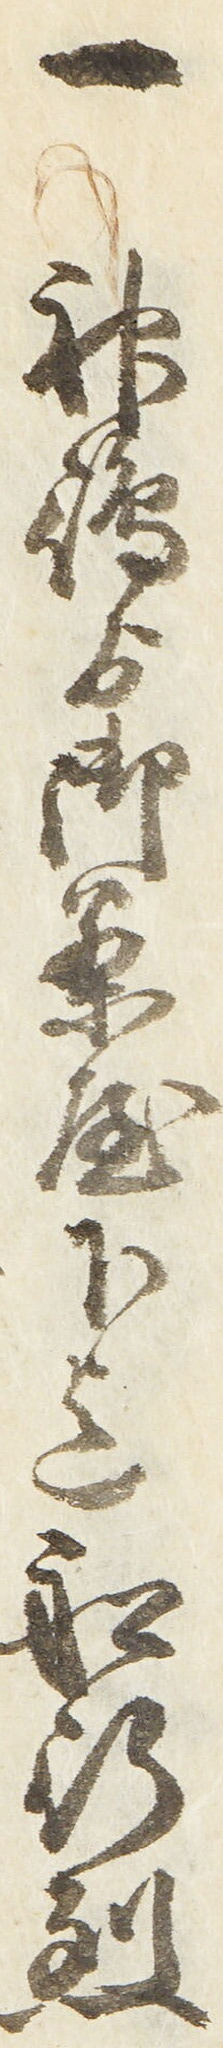一神嶋ゟ御茶屋下迄船行烈
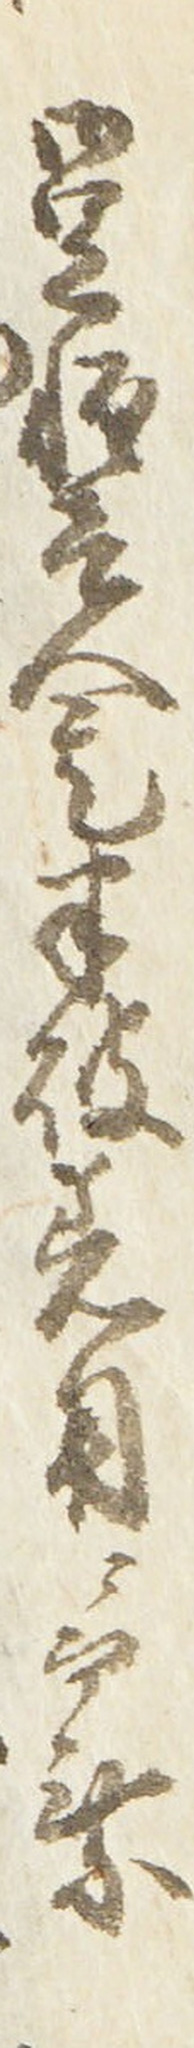御足軽壱人充半被着用ニ而乗
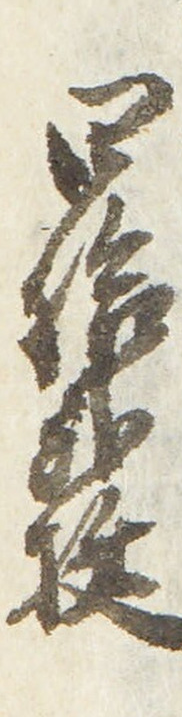四拾弐挺
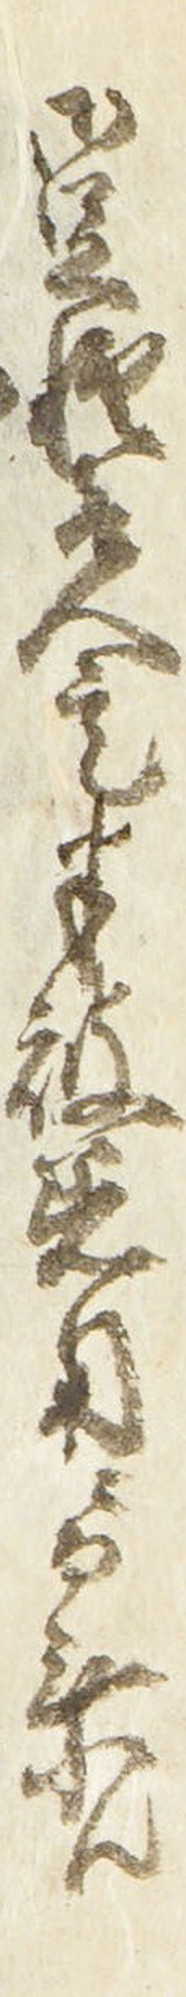御足軽壱人充半被着用ニ而乗ル
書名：玄海嶋江漂着船為警固長崎江被越候覚
